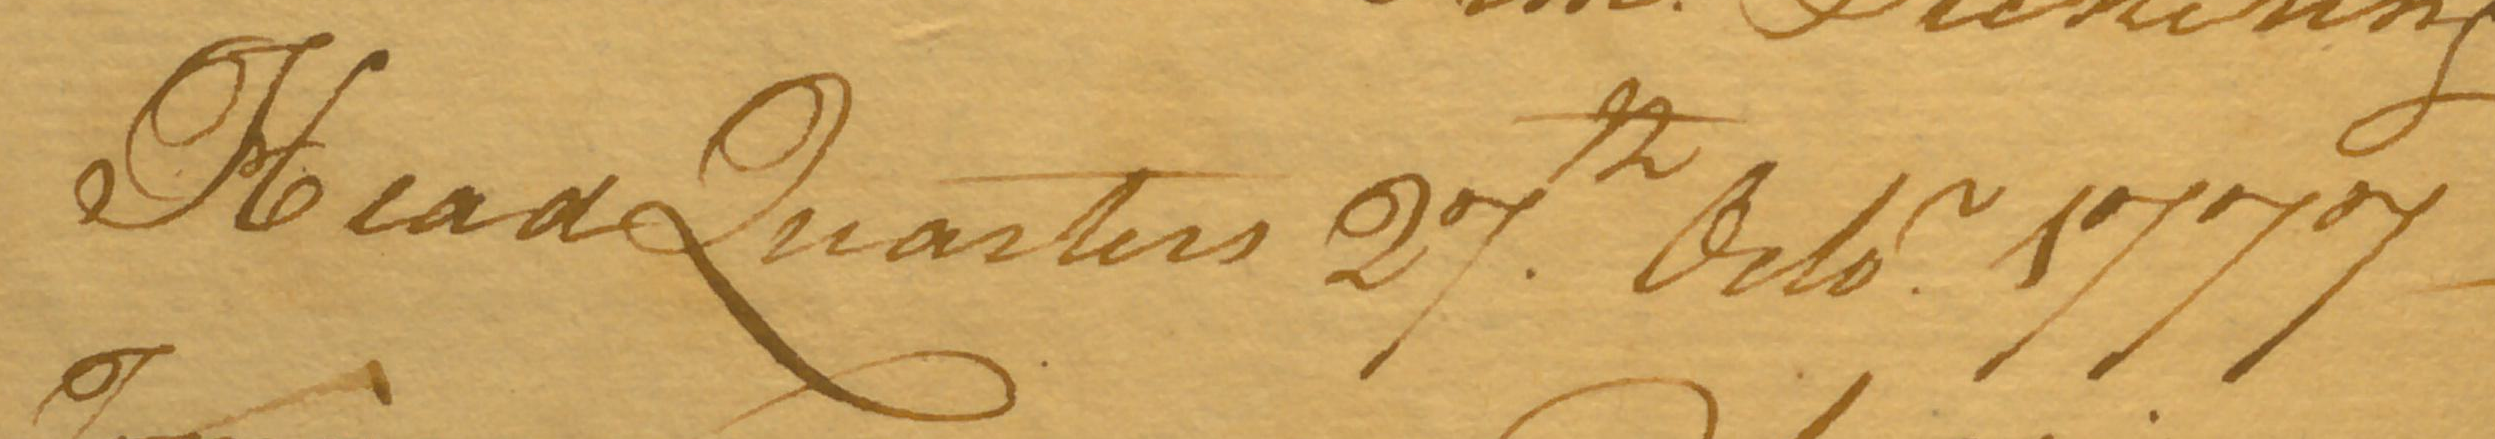Head Quarters 27^th. Octo^r. 1777-
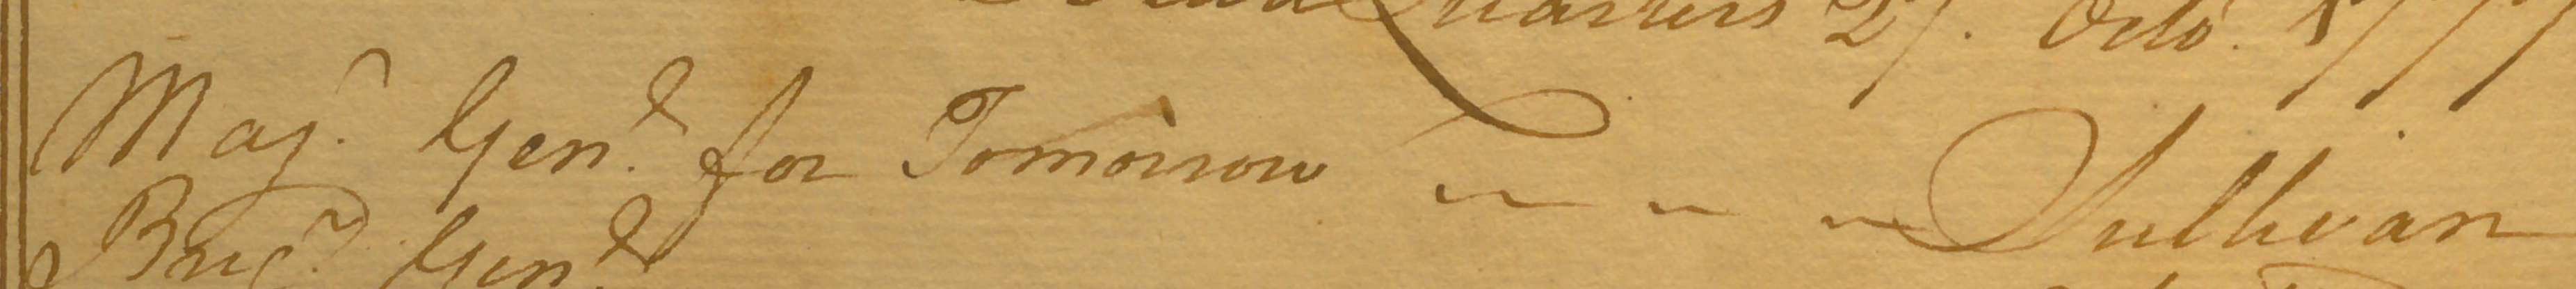Maj^r. Gen^l. for Tomorrow - - - Sullivan
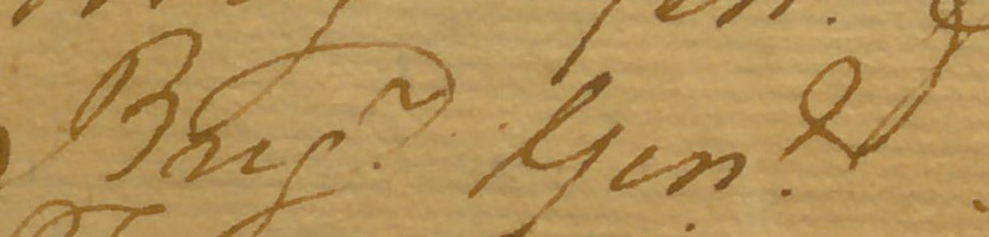Brig^r. Gen^l.
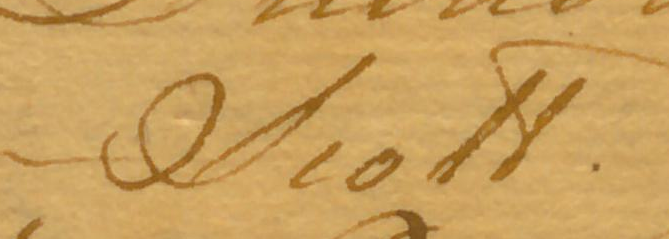Scott.
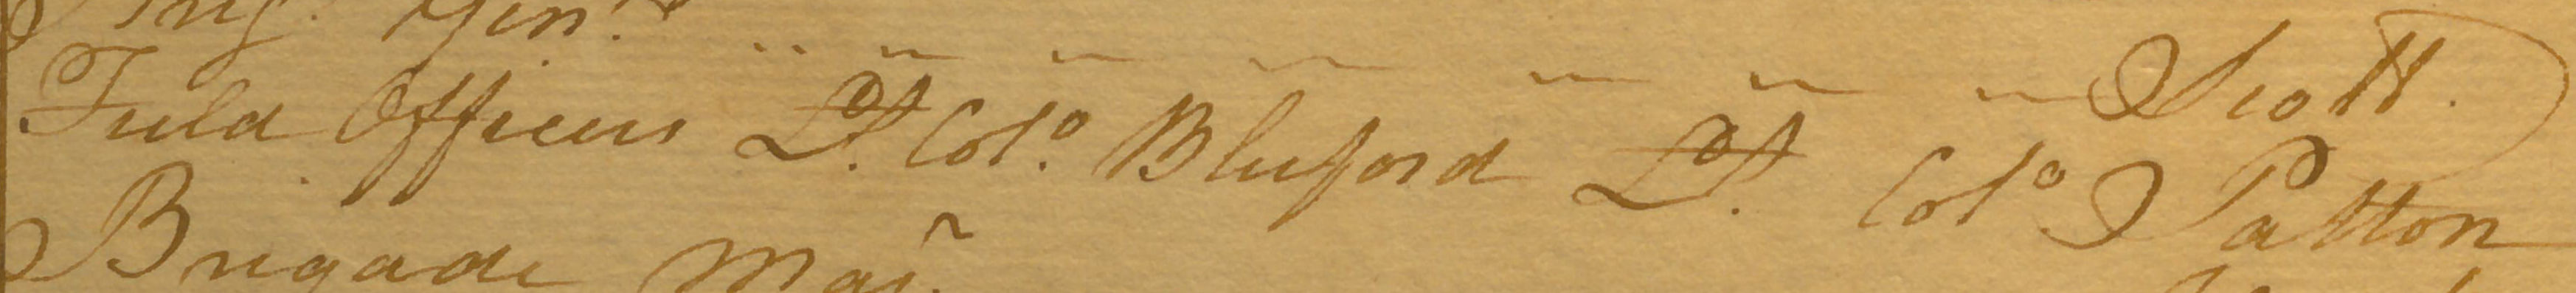Field Officers L^t. Col^o. Bluford L^t. Col^o. Patton
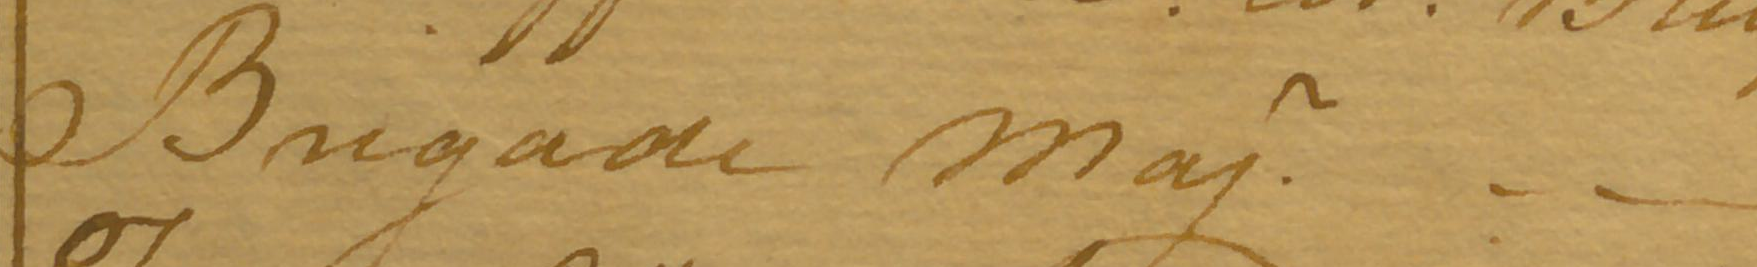Brigade Maj^r. --
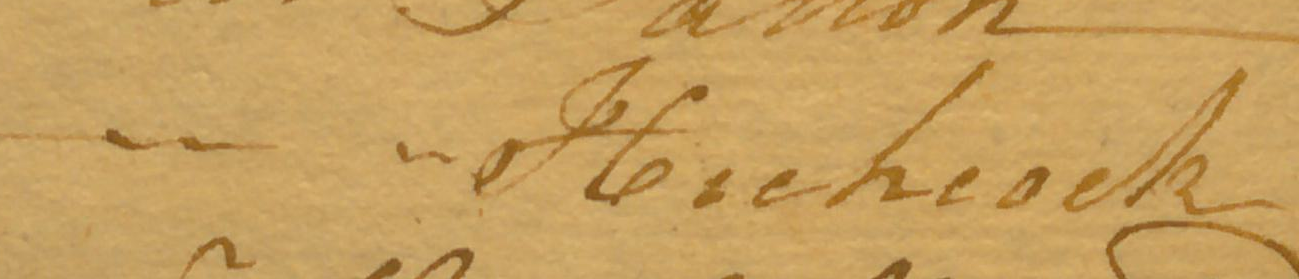Hichcock
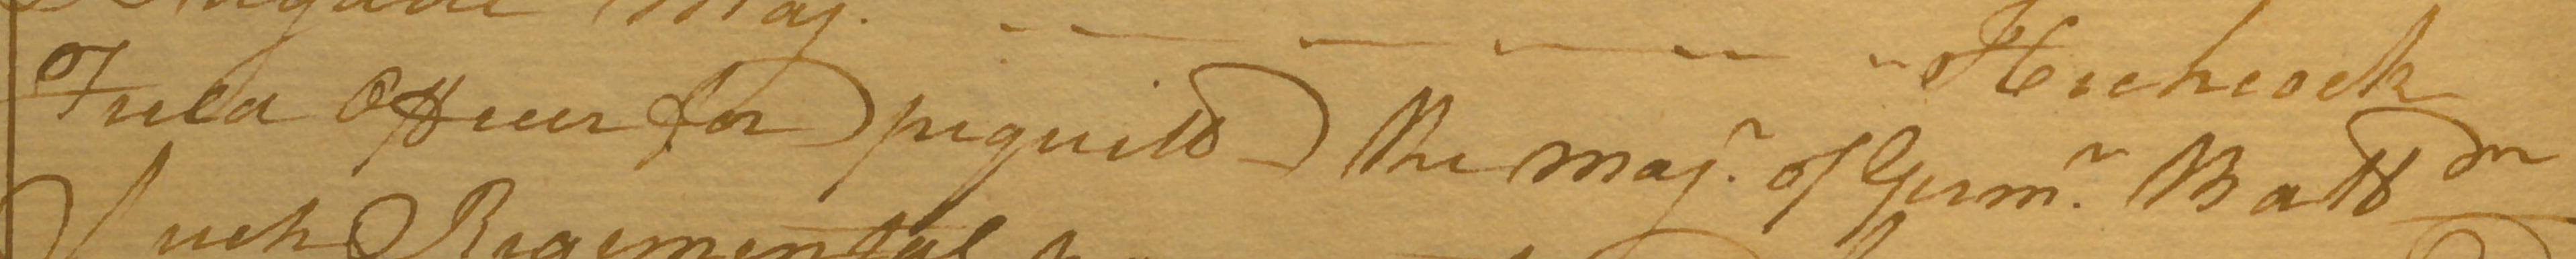Field Officer for piquits- the Maj^r. of Germ^n. Batt^n
